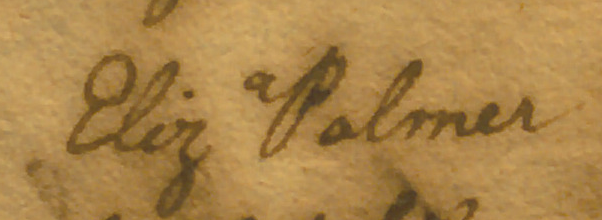Eliz^a Palmer
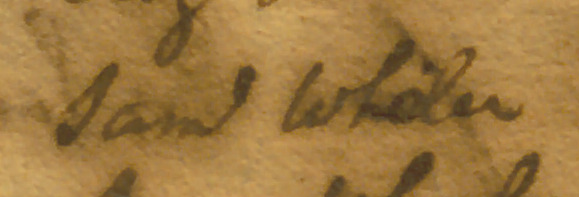Saml Wheler
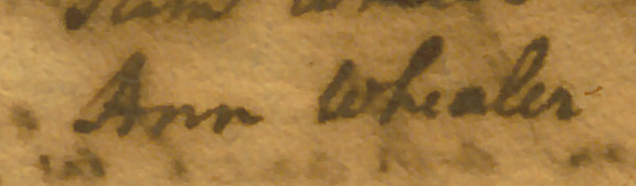Ann Whealer
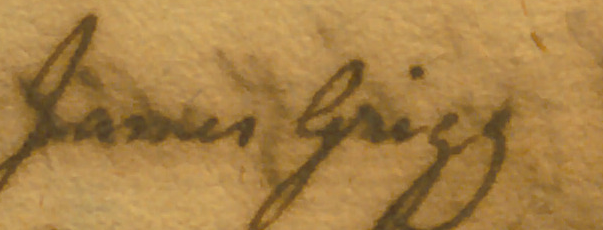James Grigg
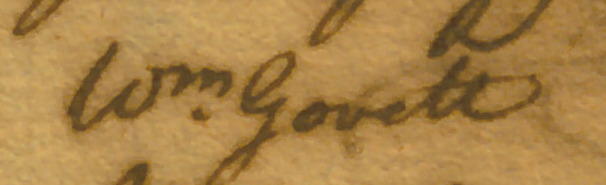W^m. Gorett
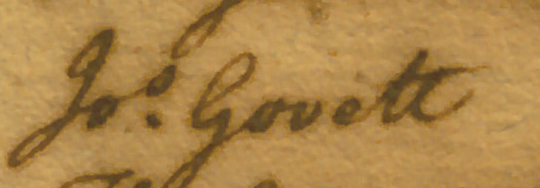Jo^s. Gorett
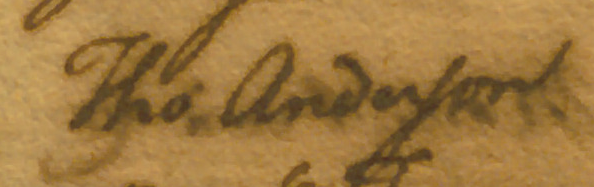Tho Anderson
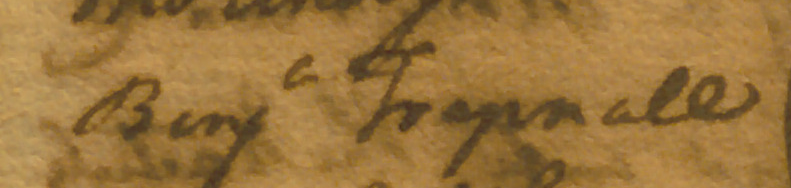Benj^a Trapnall
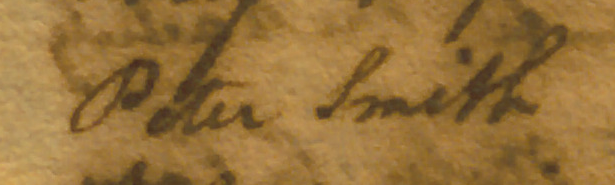Peter Smith
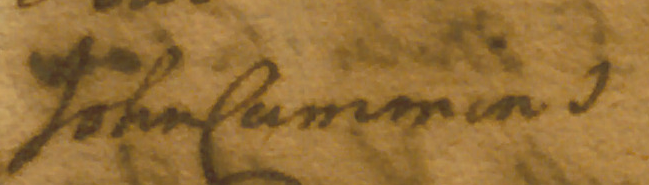John Cummins
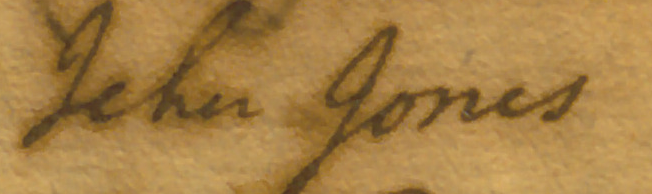John Jones
